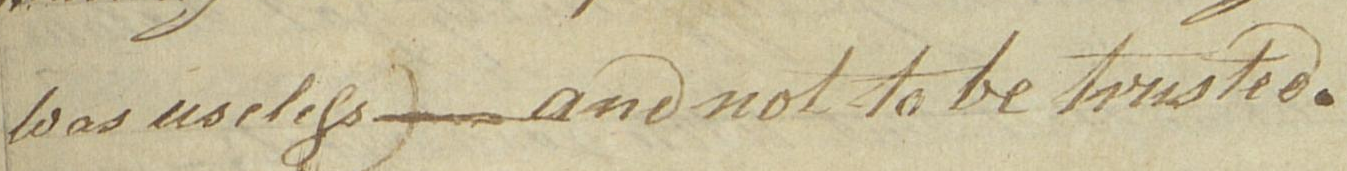was useless, and not to be trusted.
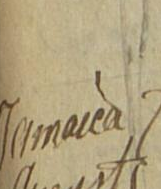Jamaica
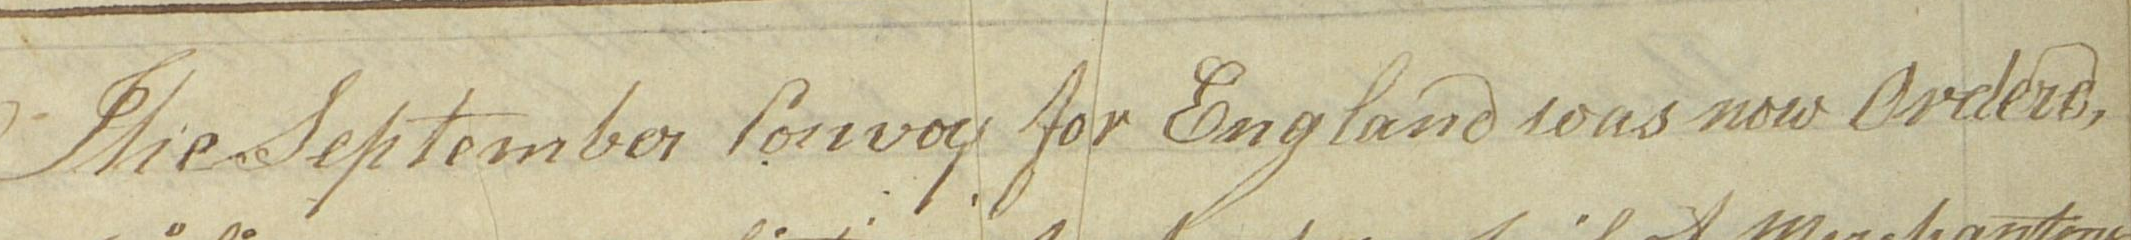The September Convoy for England was now Orderd,
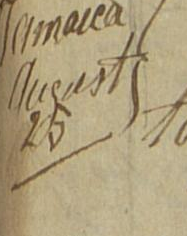August
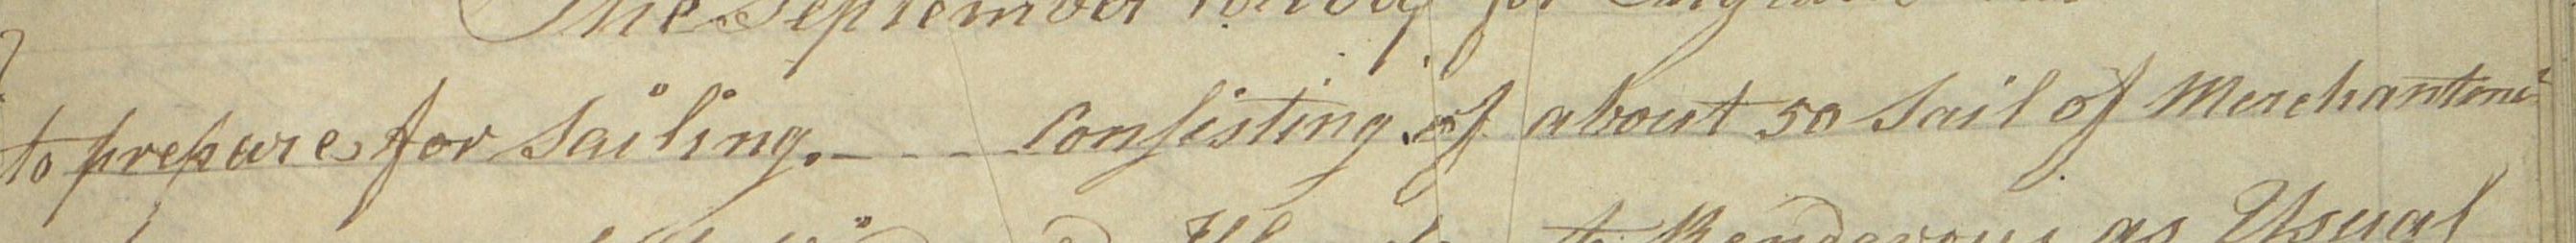to presure for sailing. Consisting of about 50 Sail of Merchantmen
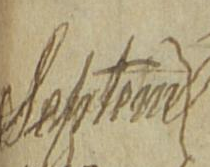Septem^r
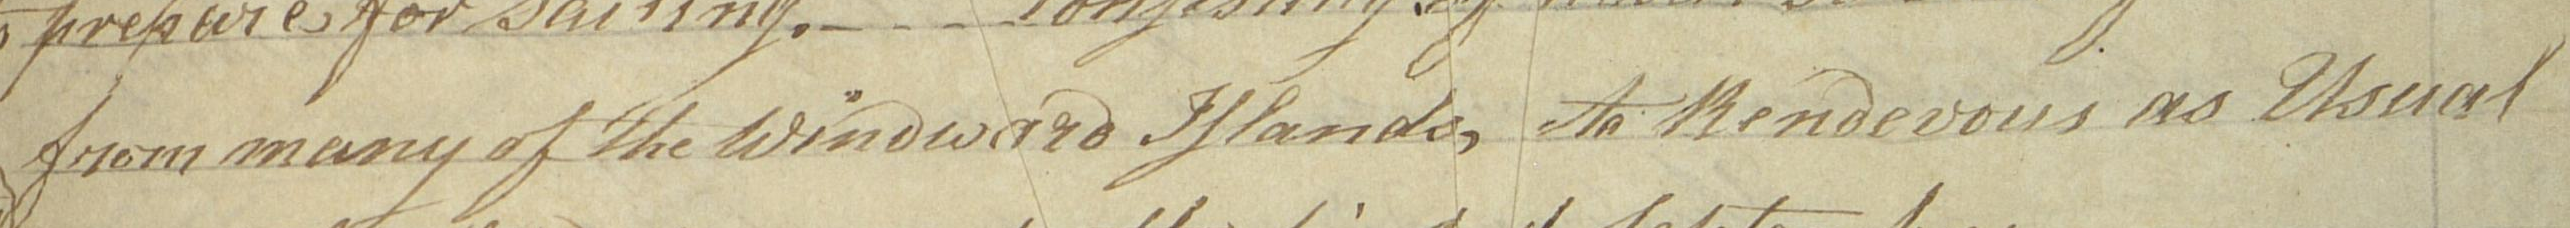from many of the Windward Islands, to Rendevous as Usual
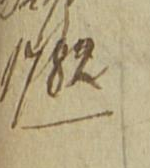1782
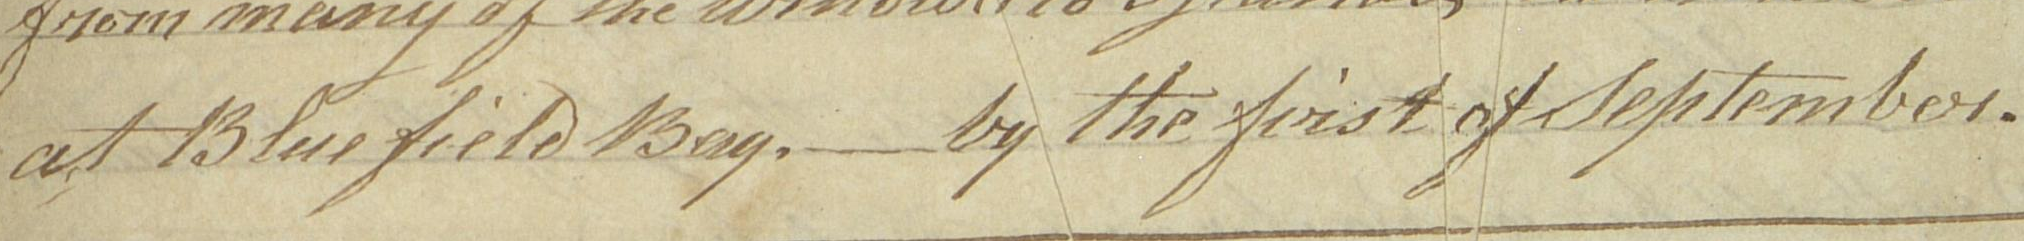at Bluefield Bay. by the first of September.
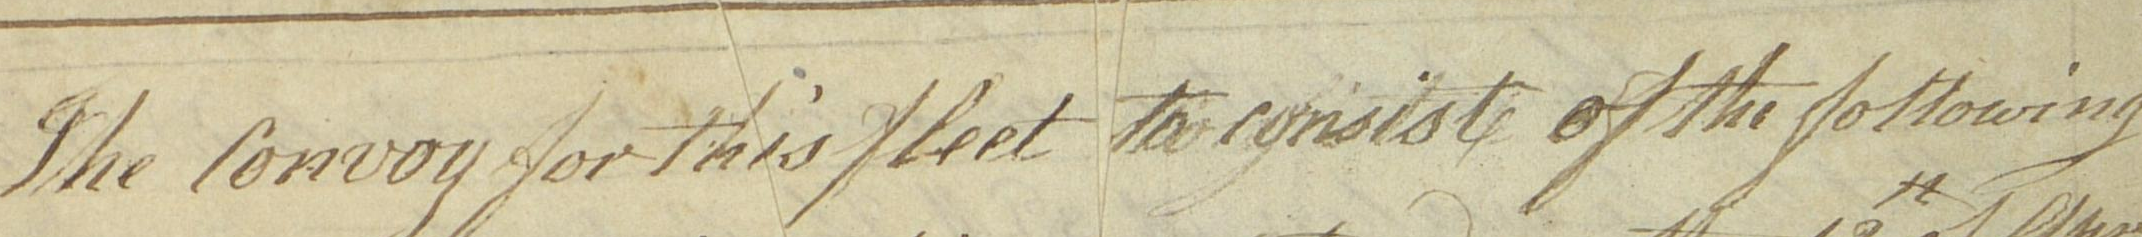The Convoy for this fleet to consist of the following
